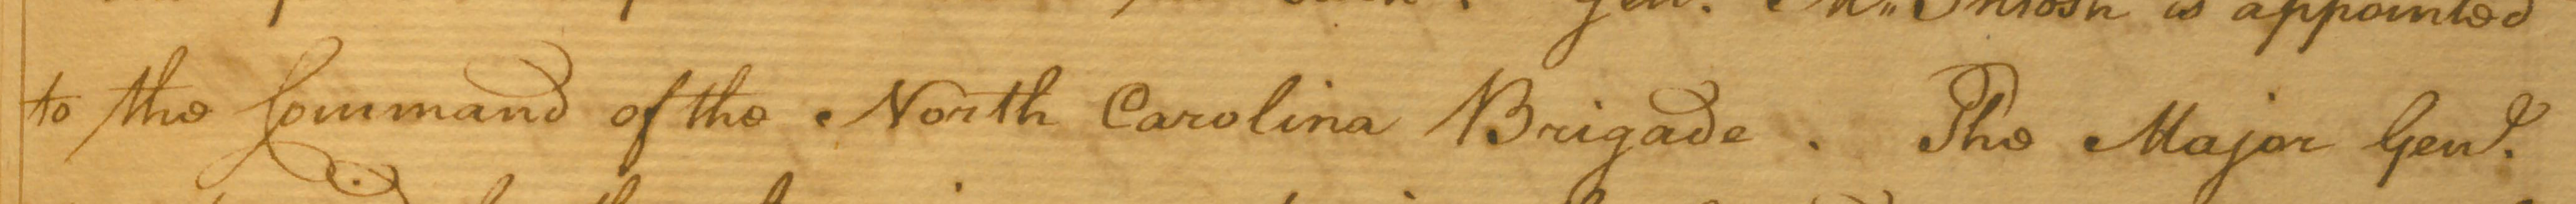to the Command of the North Carolina Brigade. The Major Gen^l.
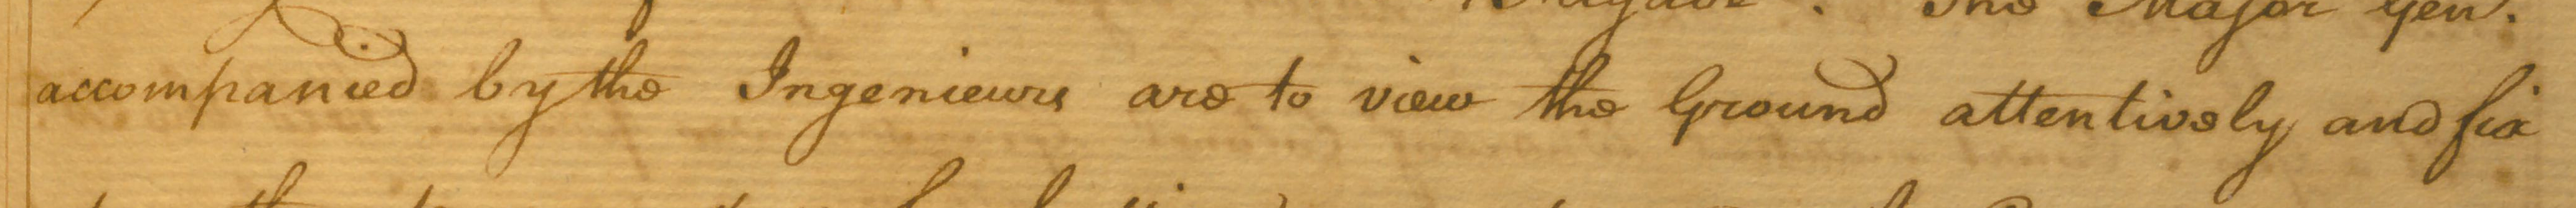accompanied by the Ingenieurs are to view the Ground attentively and fix
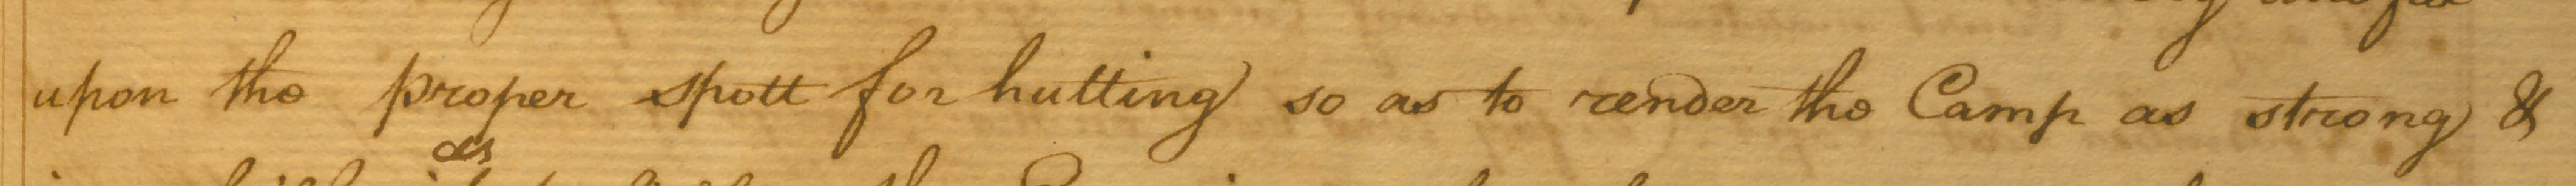upon the proper spott for hutting so as to render the Camp as strong &
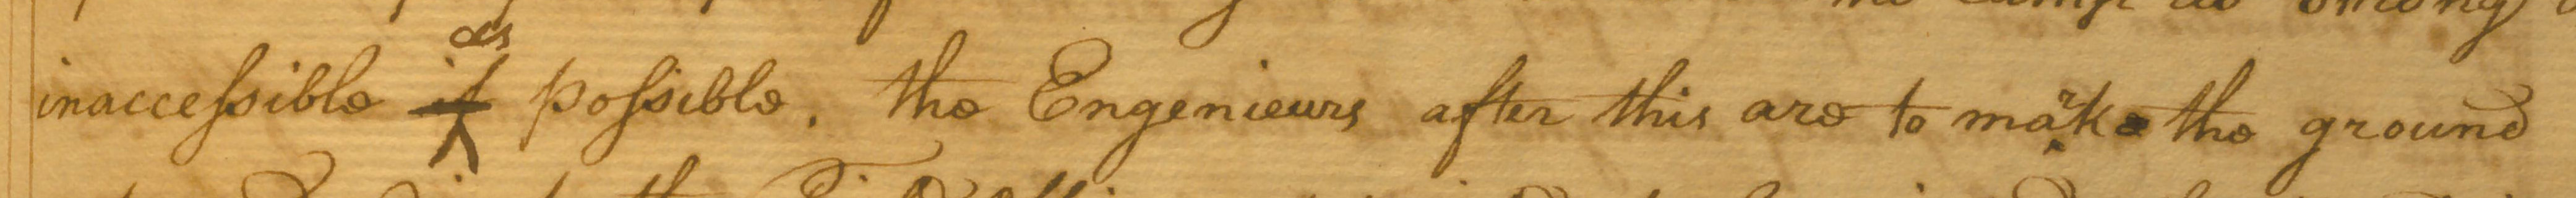inaccessible [__] ^as possible. the Enginieurs after this are to make the ground
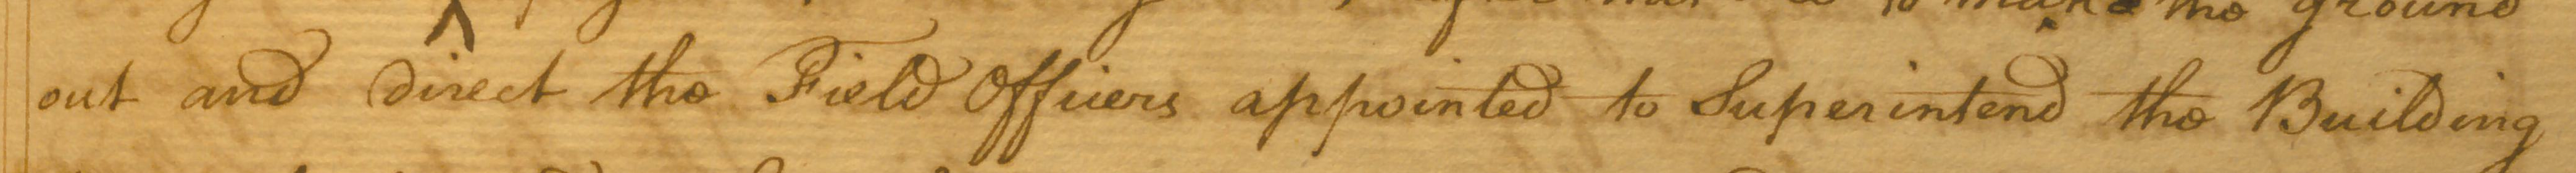out and direct the Field Officers appointed to Superintend the Building
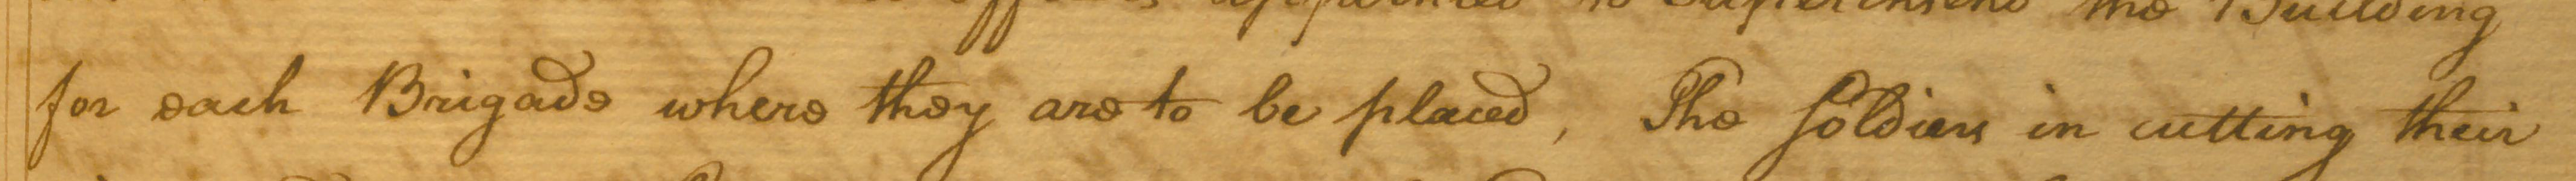for each Brigade where they are to be placed. The Soldiers in cutting their
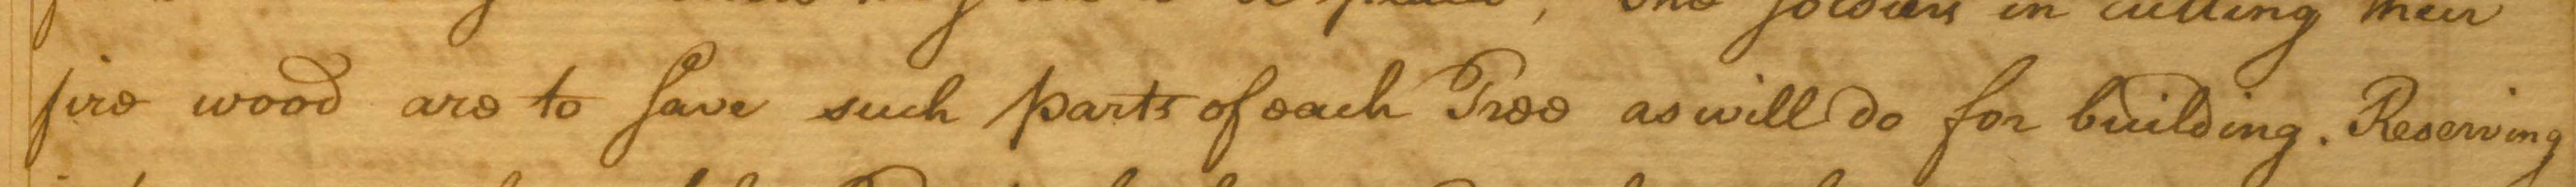fire wood are to save such parts of each Tree as will do for building. Reserving
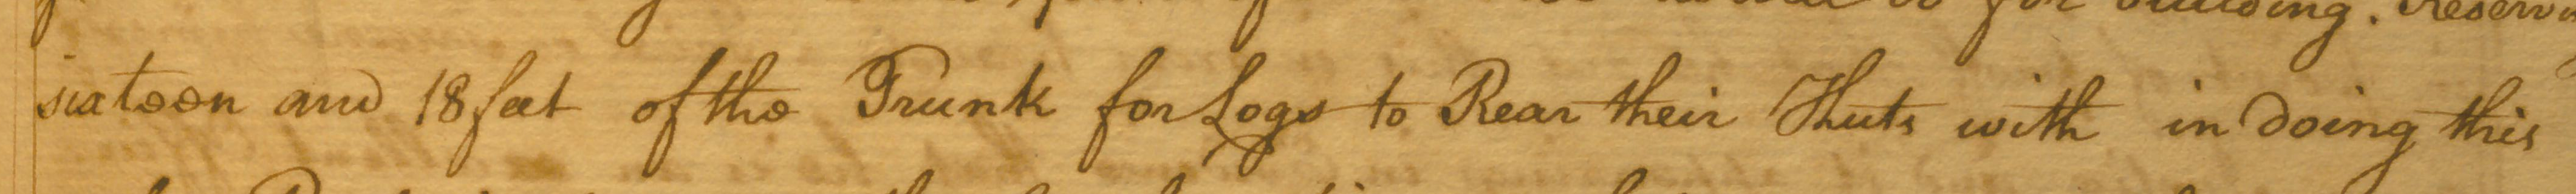sixteen and 18 feet of the Trunk for Logs to Rear their Huts with in doing this
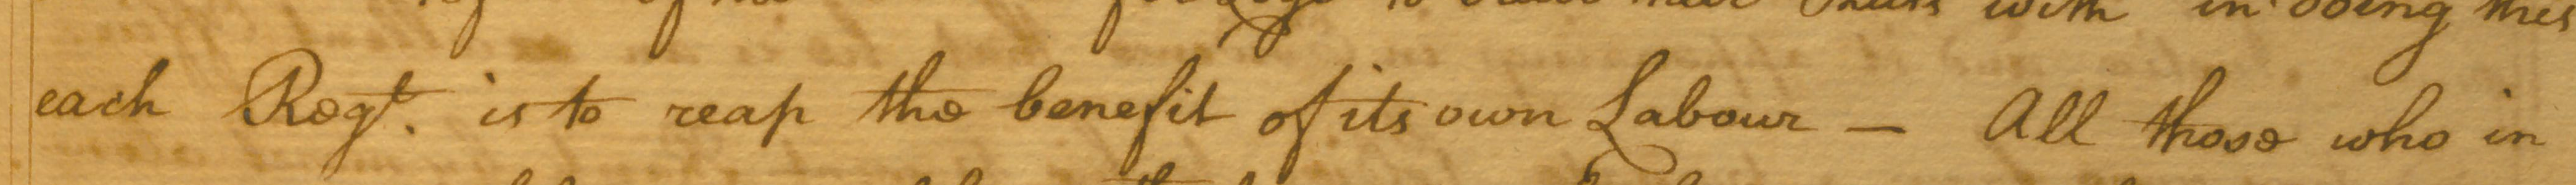each Reg^t. is to reap the benefit of its own Labour- All those who in
